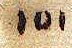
101
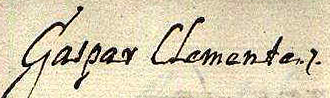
Gaspar Clemente ./.
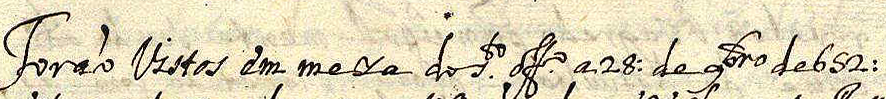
Foraõ Vistos em meza do s.to off.o a 28: de 9b̄ro de 652:
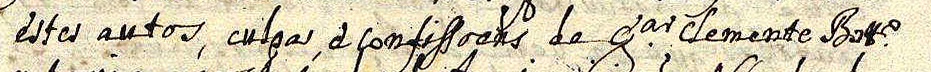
estes autos, culpas, e confissoens de G.ar clemente Bott.o
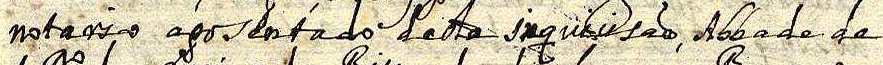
notario aposentado desta inquisisaõ, Abbade de
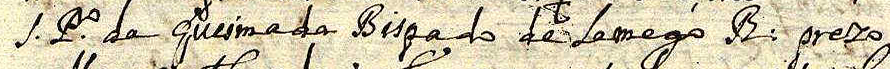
s. P.o de queima do Bispado de Lamego R. prezo
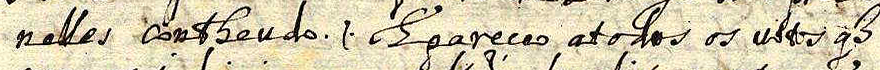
nelles contheudo ./. E pareceo a todos os uotos q̄
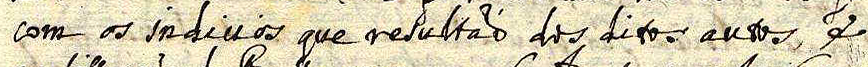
com os indicios que resultaõ dos ditos autos, e
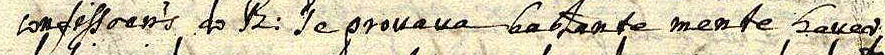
confissoens do R: se prouaua bastantemente hauer
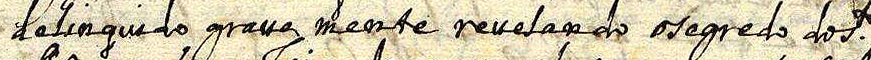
delinquido grauemente reuelando o segredo do s.to
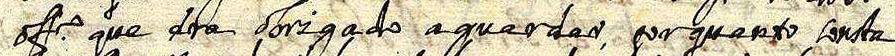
off.o que era obrigado a guardar, porquanto consta
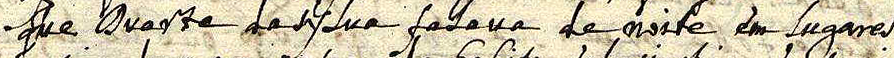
que Duarte da sylua falaua de noite em lugares
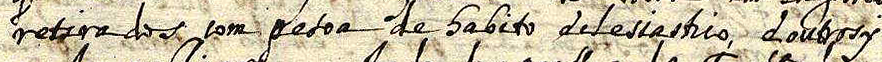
retirados com pesoa de habito eclesiastico, e outrosy
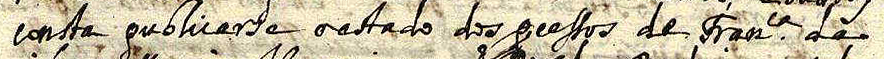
consta publicarse o estado dos ꝓcessos de Fran.ca da
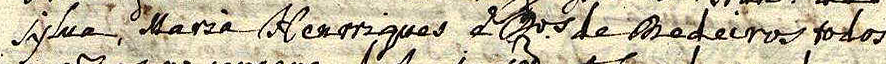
sylua, Maria Henrriques e D.os de Medeiros todos
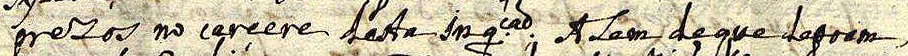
prezos no carcere desta inꝗ.çaõ. Alem de que depoem
